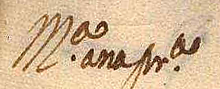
M.a ana pr.a
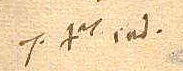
7. tas iud.
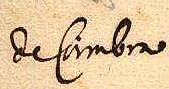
de Coimbra
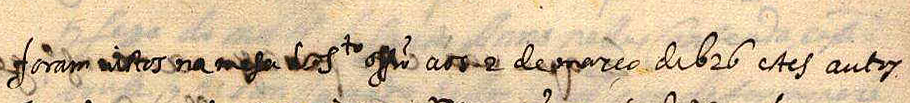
foram uistos na mesa do sto offo aos 2 de março de 626 estes autos
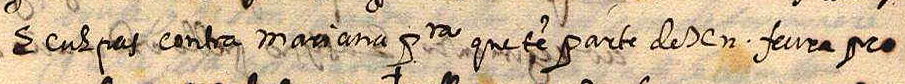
E culpas contra mariana pra que tē parte de xn. freira pro
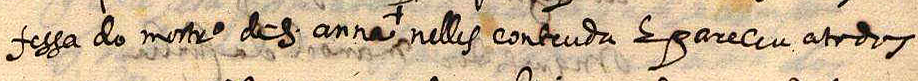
fessa do mostro de s. anna + nelles conteuda E pareceu a todos
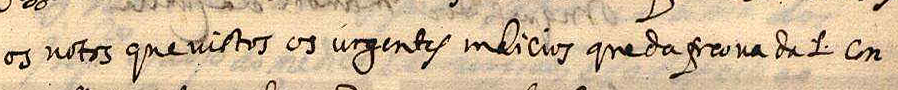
os uotos que uistos os urgentes indicios que da proua da I. con
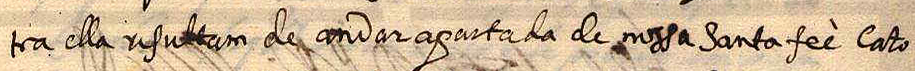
tra ella resultam de andar apartada de nossa Santa feè cato
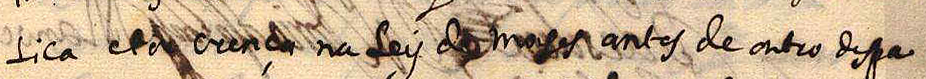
lica e ter crenca na Ley de moises antes de outro despa
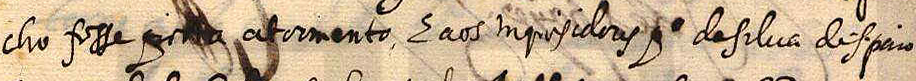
cho fosse posta a tormento, E aos Inquisidores po da silua de s. paio
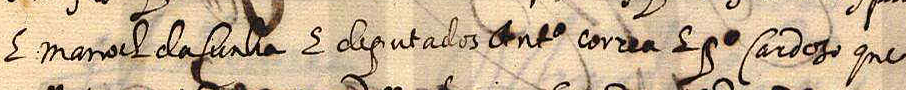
E manoel da Cunha E deputados Anto correa E po Cardoso que
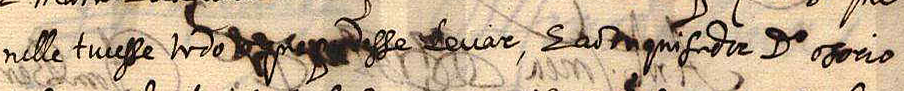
nelle tiuesse todo o que pudesse Leuar, E ao inquisidor Do osorio
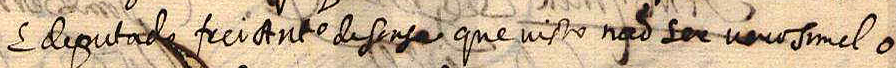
E deputado frei Anto de sousa que uisto naõ ser uerosimel o
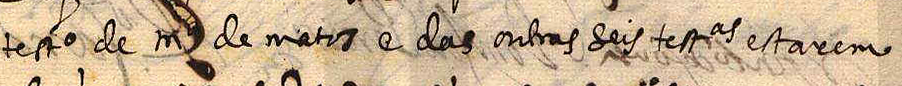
testo de ma de matos e das outras seis testas estarem
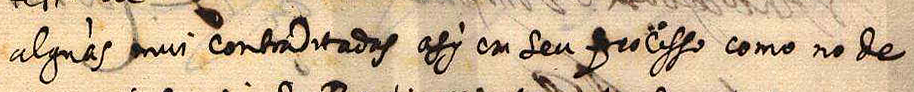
alguās mui contraditadas asy em seu processo como no de
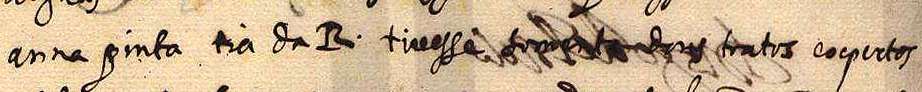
anna pinta tia da R. tiuesse somente dous tratos expertos
